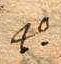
4.o
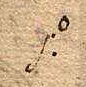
1.o
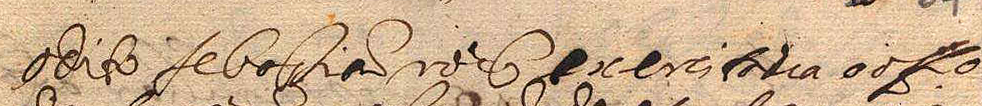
o dito sebastiaõ roiz̄ exercitaua o off.o
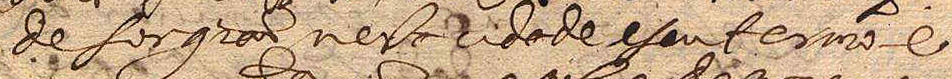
de sorgiaõ nesta cidade e seu termo e
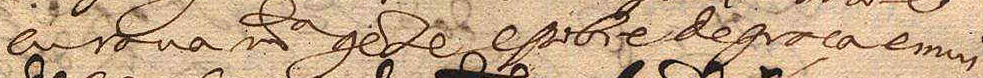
curaua mta gēte e pobre de graça e mui
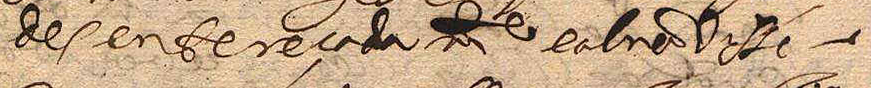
desentereçadamte e al nā dysse -
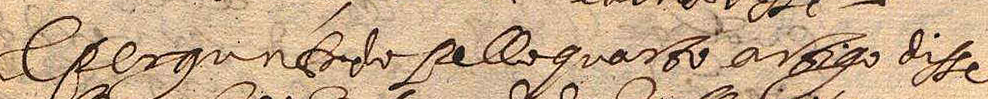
E perguntado pello quarto artigo disse
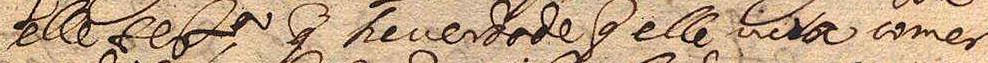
elle testa, q̄ he uerdade q̄ elle uira comer
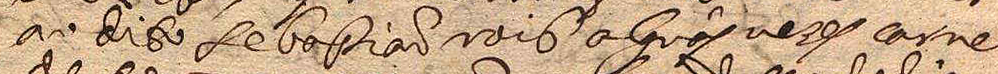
ao dito sebastiaõ rois̄ alguās uezes carne
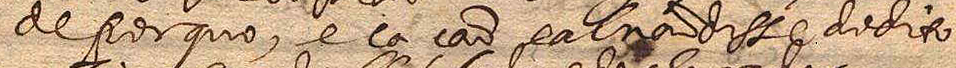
de porquo, e caçaõ e al naõ disse do dito
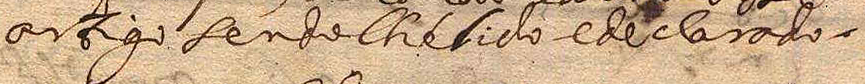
artigo sendolhe lido e declarado.
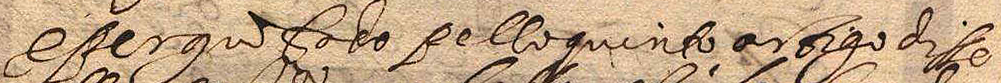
e pergūtado pello quinto artigo disse
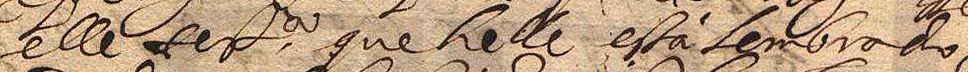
elle testa, que helle está Lembrado
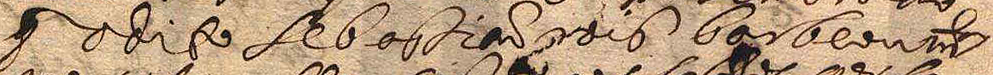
q̄ o dito sebastiaõ rois̄ barbeou mtas
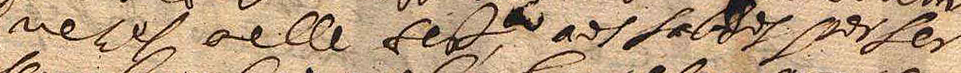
uezes a elle testa, aos sabdos por ser
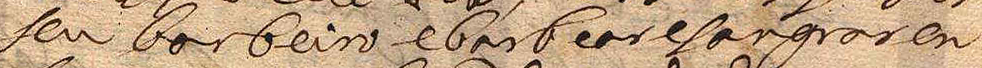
seu barbeiro e barbear e sangrar en
